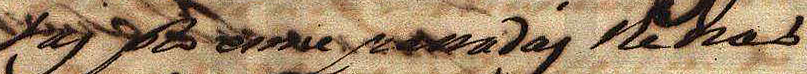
tas proxime passadas lhe naõ
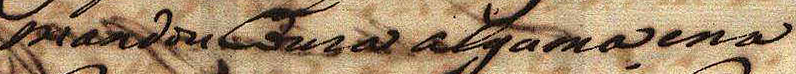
mandou Couza alguma e na
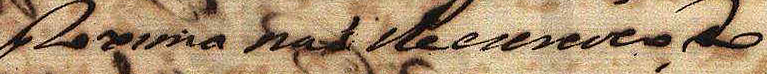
proxima naõ lhe escreveo, do
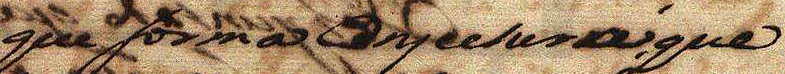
que forma conjectura, que
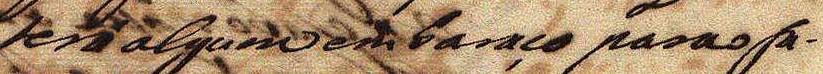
tera algum embaraço para o fa
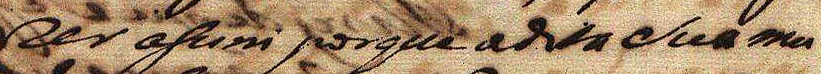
zer assim porque a dita Sua mu
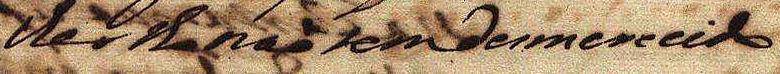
lher lhe naõ tem desmerecido
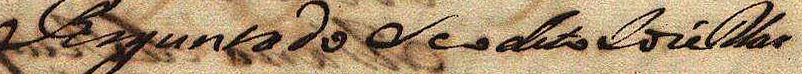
Perguntado Se o dito Iozé Mar
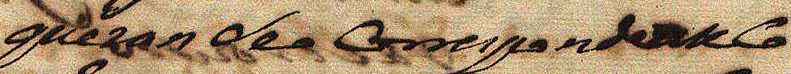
quezan Seo Correspondente Co
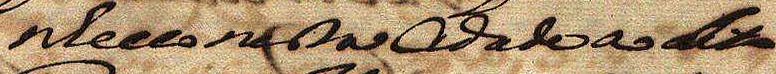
nheceo nesta Cidade ao dito
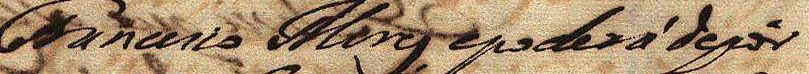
Francisco Alvres e poderá depor
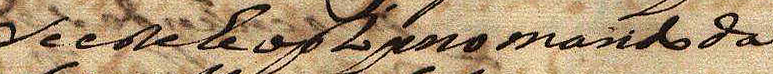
Se este he o proprio marido da
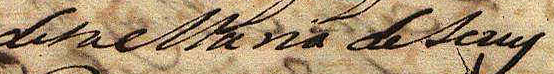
dita Maria de Iezus
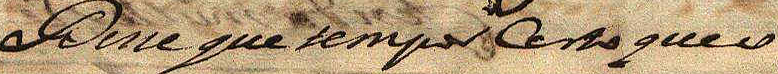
Desse que tem por Certo que o
